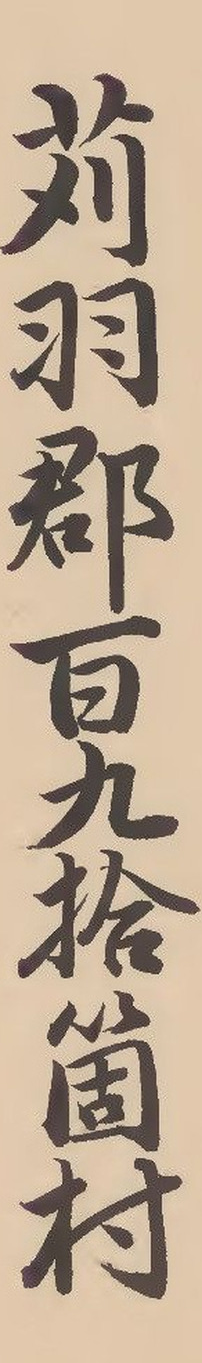苅羽郡百九拾箇村

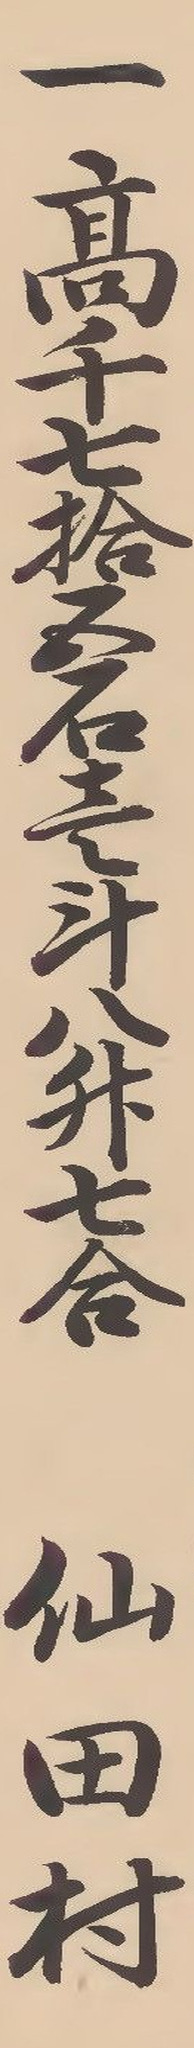一高千七拾五石壱斗八升七合仙田村
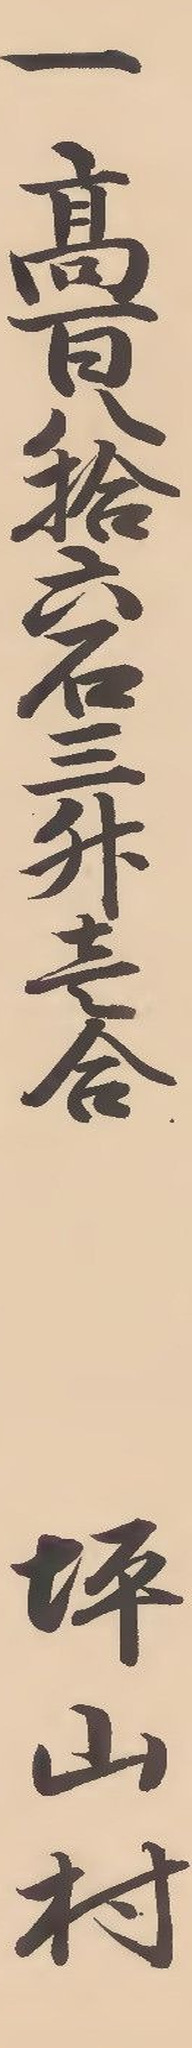一高百八拾六石三升壱合坪山村
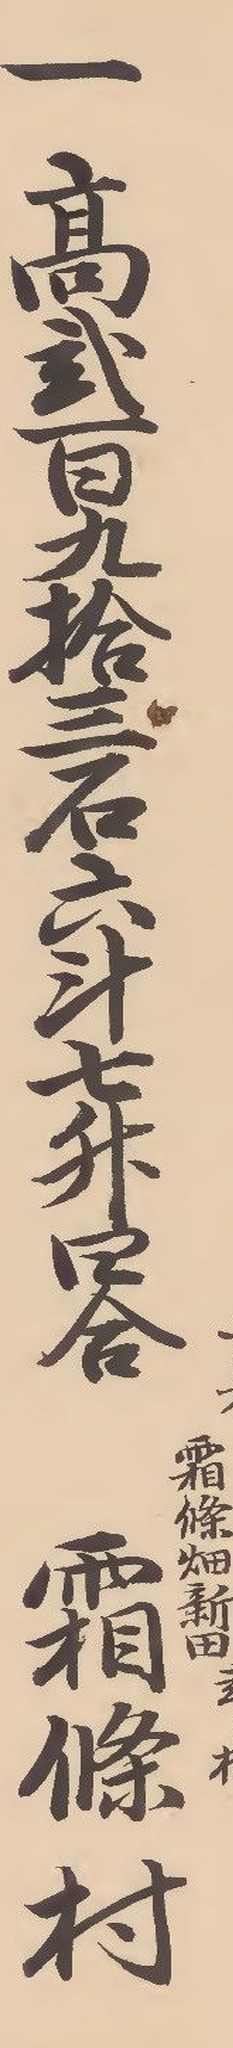一高弐百九拾三石六斗七升四合霜条村
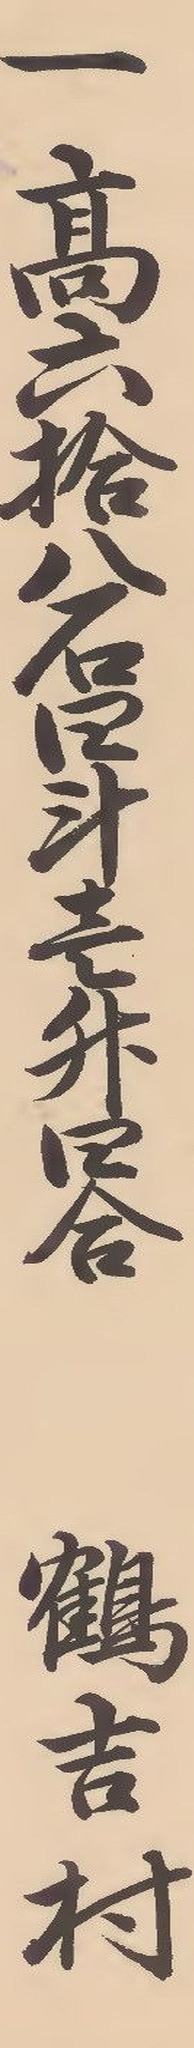一高六拾八石四斗壱升四合鶴吉村
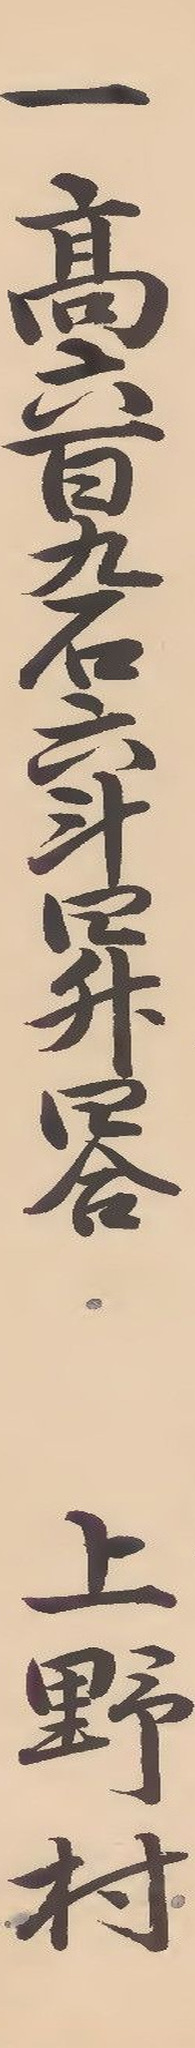一高六百九石六斗四升四合上野村

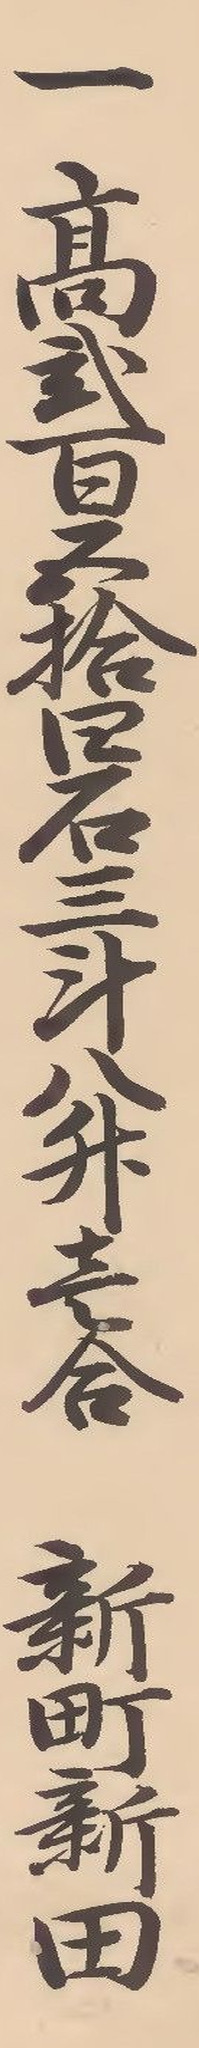一高弐百五拾四石三斗八升壱合新町新田
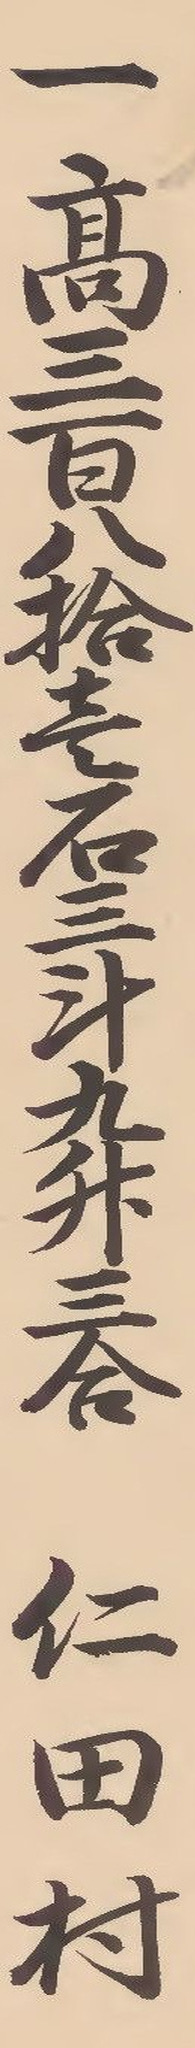一高三百八拾壱石三斗九升三合仁田村
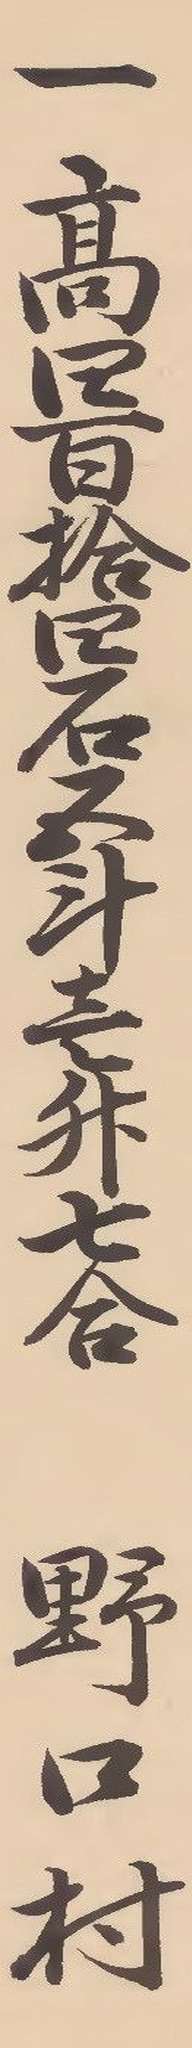一高四百拾四石五斗壱升七合野口村
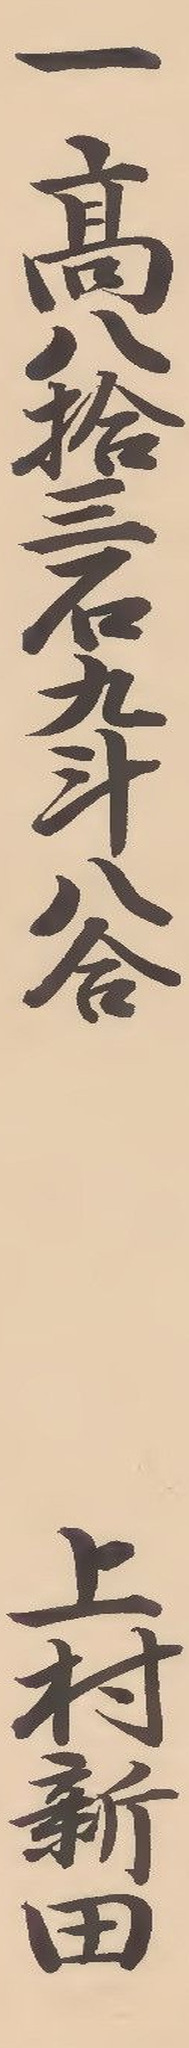一高八拾三石九斗八合上村新田
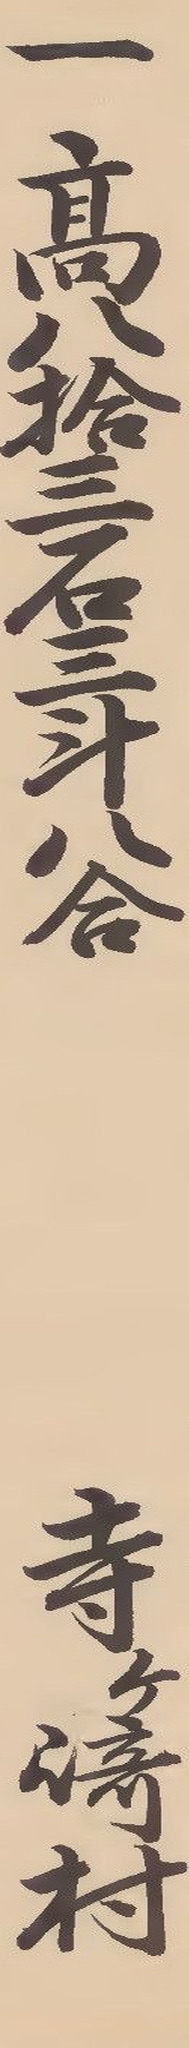一高八拾三石三斗八合寺ヶ崎村
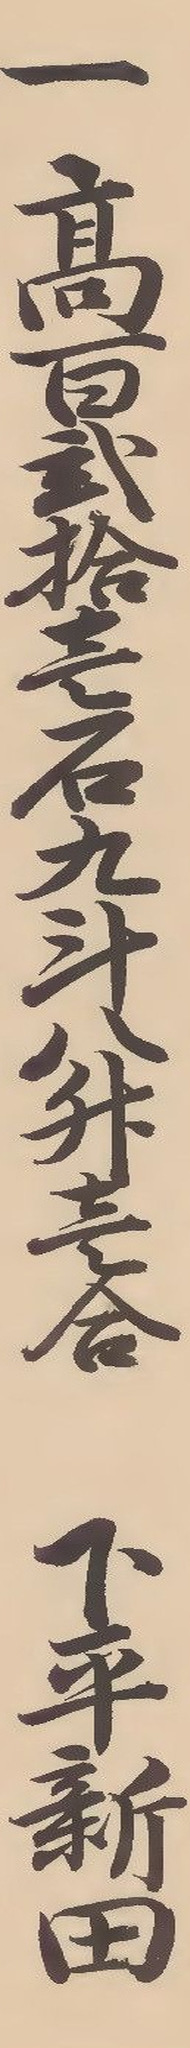一高百弐拾壱石九斗八升壱合下平新田
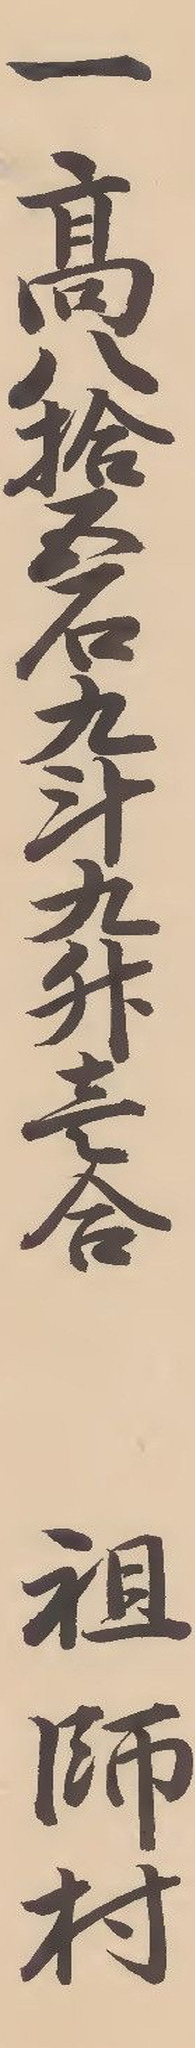一高八拾五石九斗九升壱合祖師村
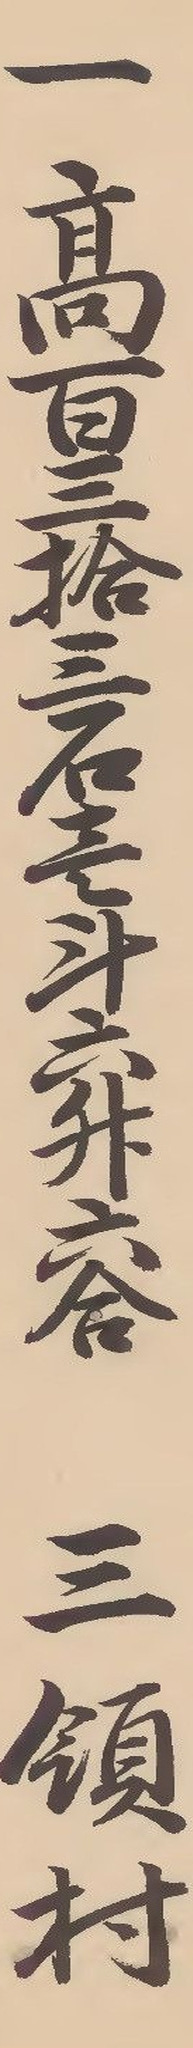一高百三拾三石壱斗六升六合三領村

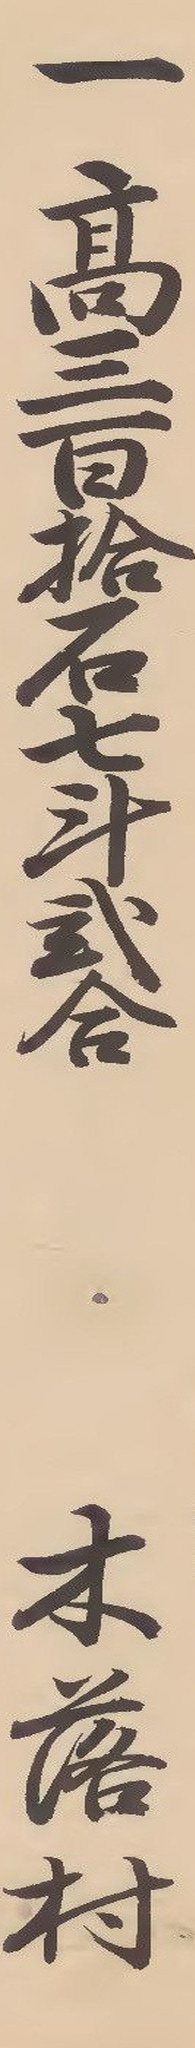一高三百拾石七斗弐合木落村
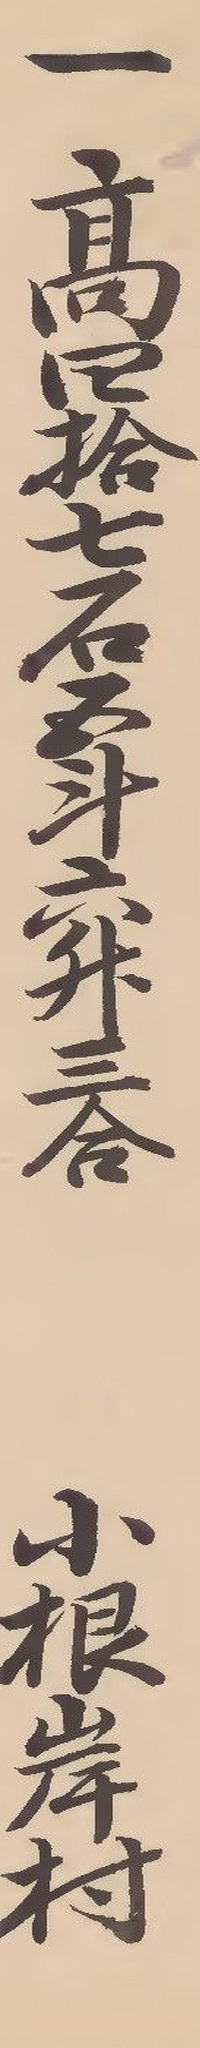一高四拾七石五斗六升三合小根岸村
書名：越後国郷帳　中
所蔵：国立公文書館 National Archives of Japan
